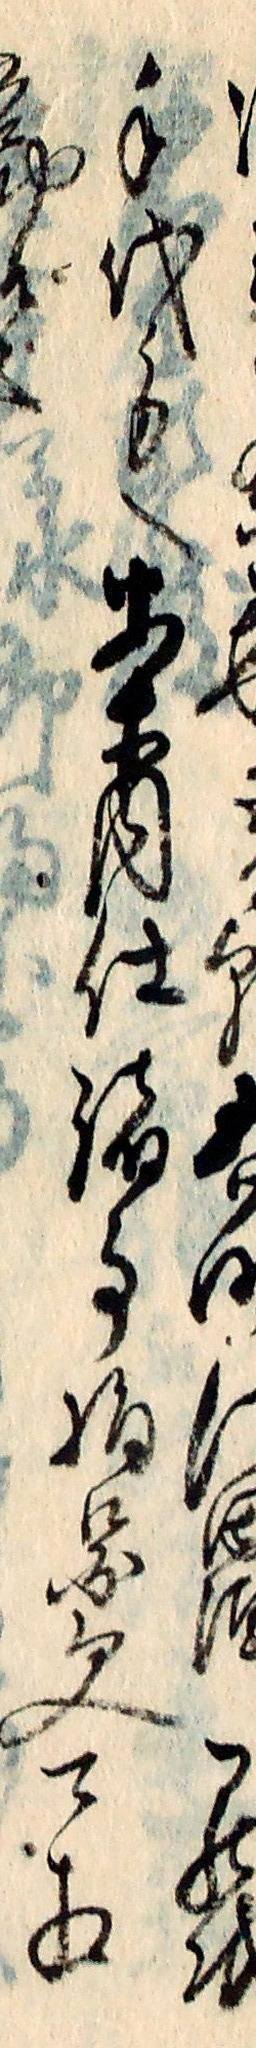手代方へ案内仕諸事指図受可相
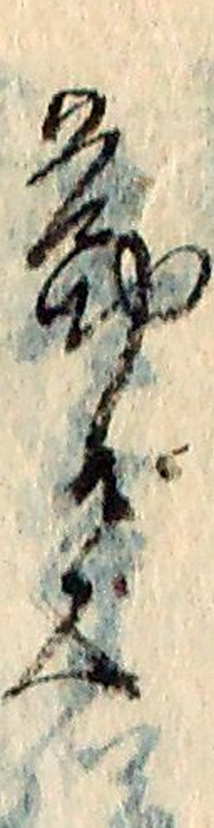勤候以上
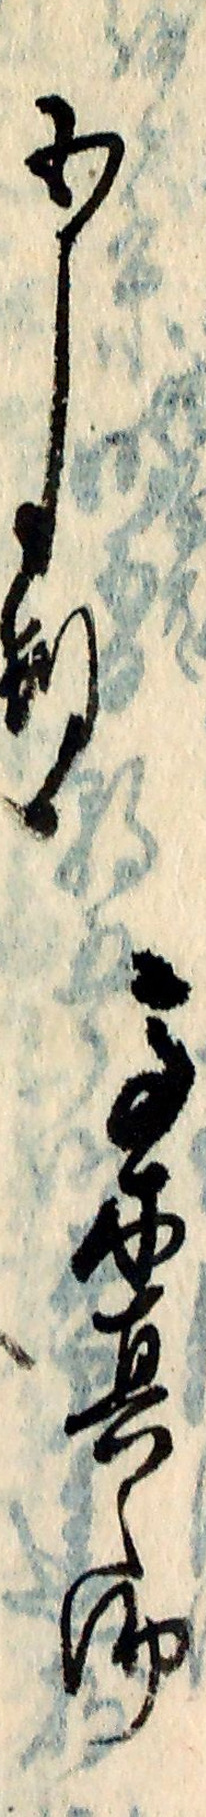五月朔日高木真之助
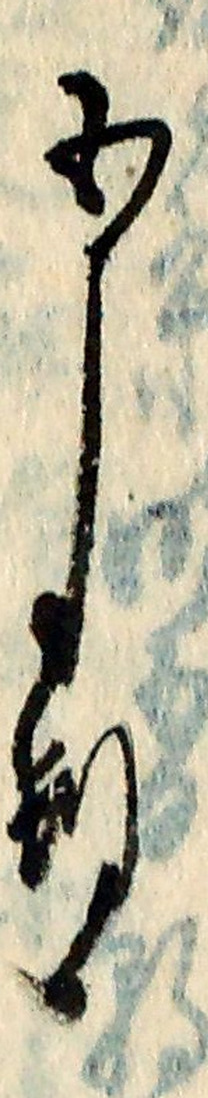五月朔日
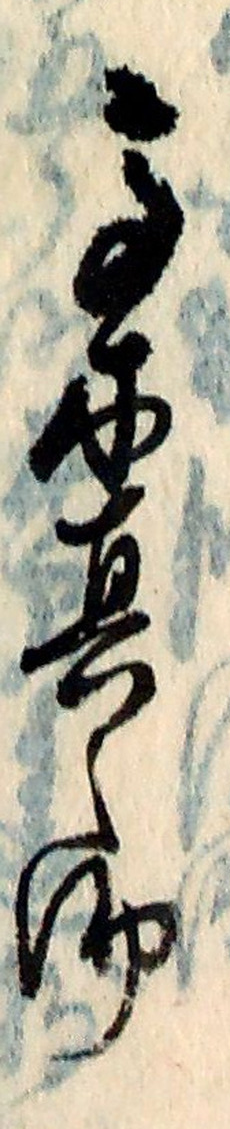高木真之助
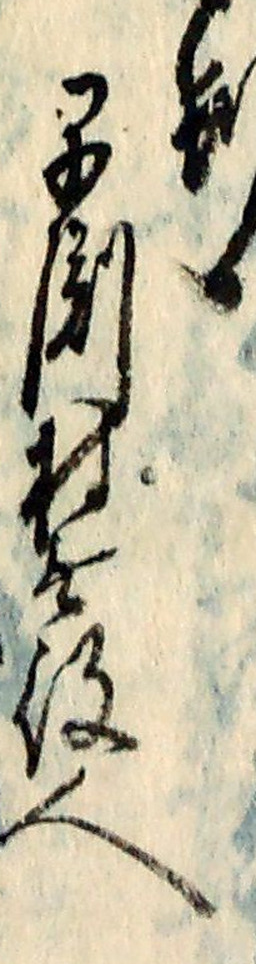早淵村無役人
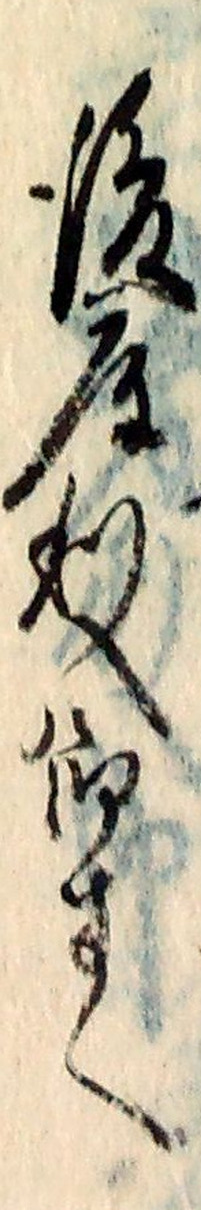後藤利八郎方へ
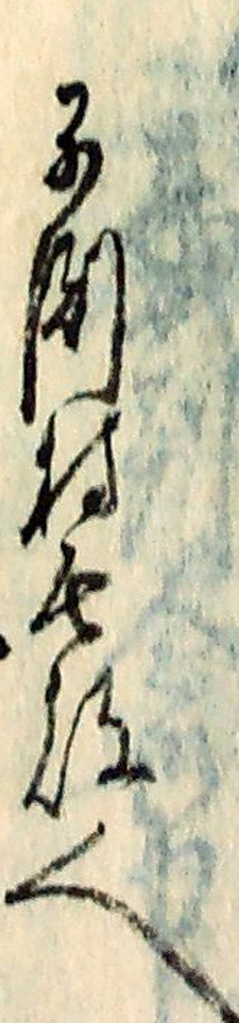早淵村無役人
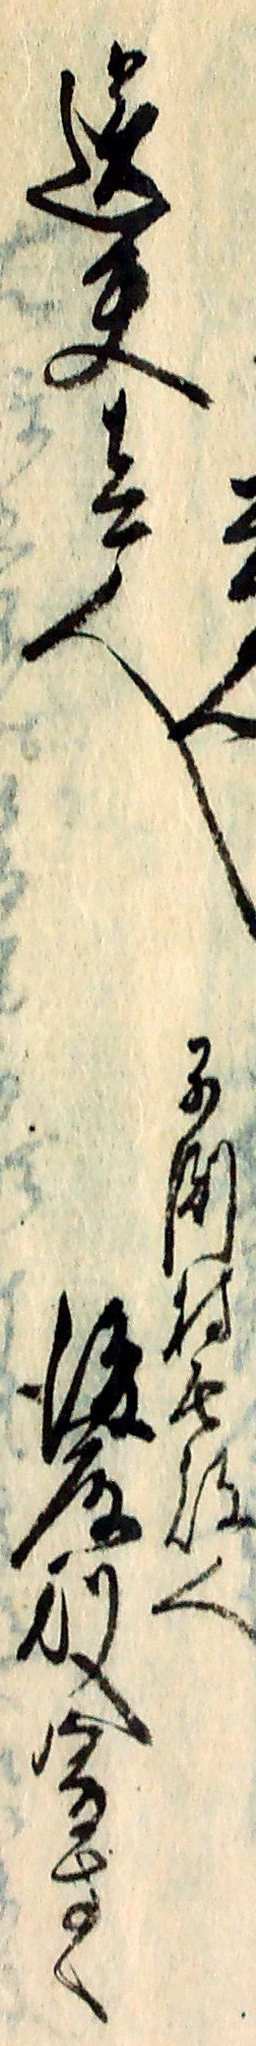送夫壱人後藤利八郎方へ
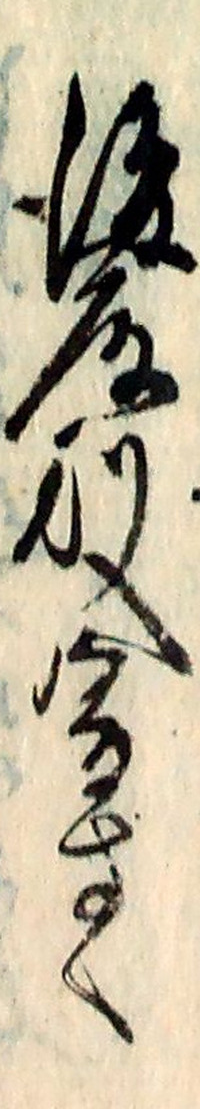後藤利八郎方へ
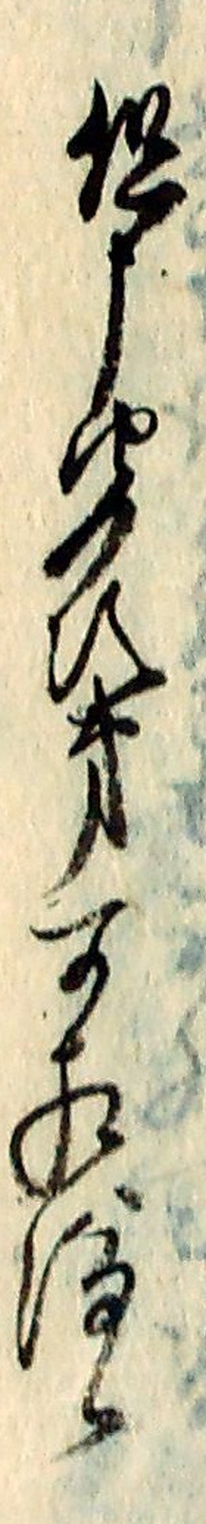但し聞次弟可相渡候
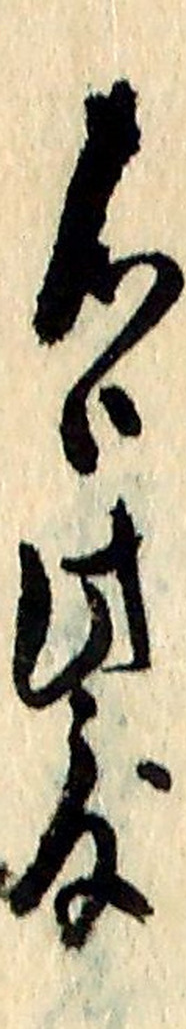右は此度
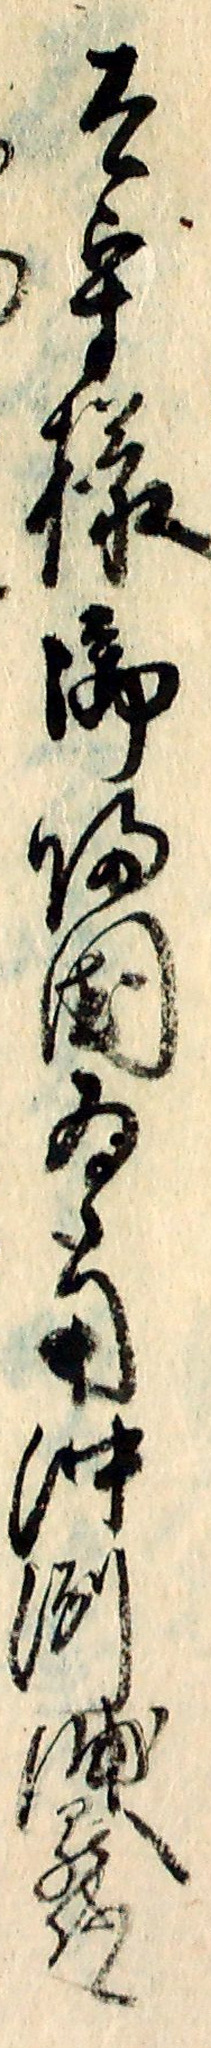太守様御帰国為御用沖洲浦へ罷越候
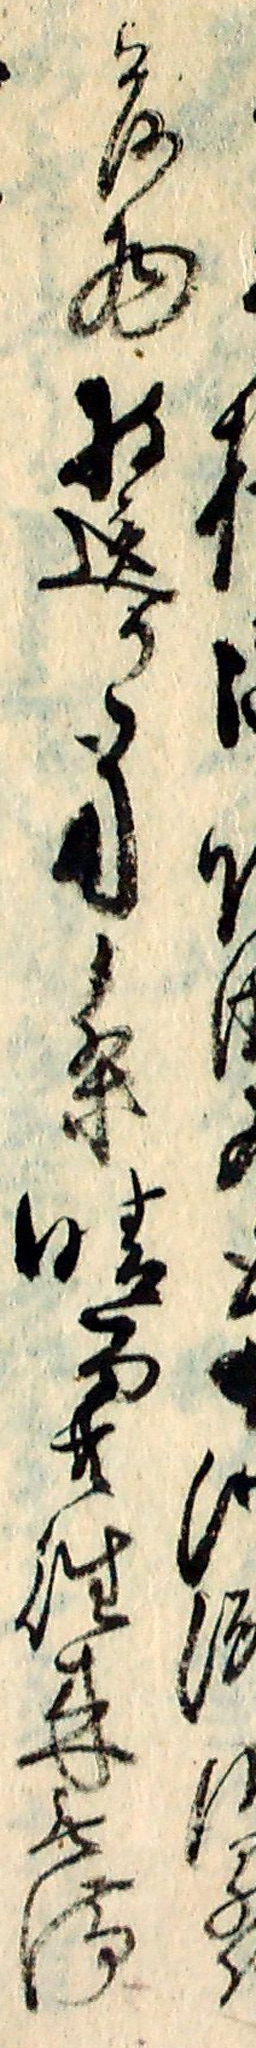荷物持送り御用候条晴雨共往来無滞
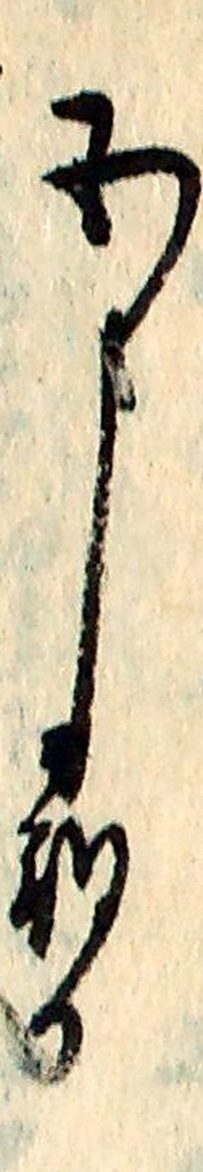五月朔日
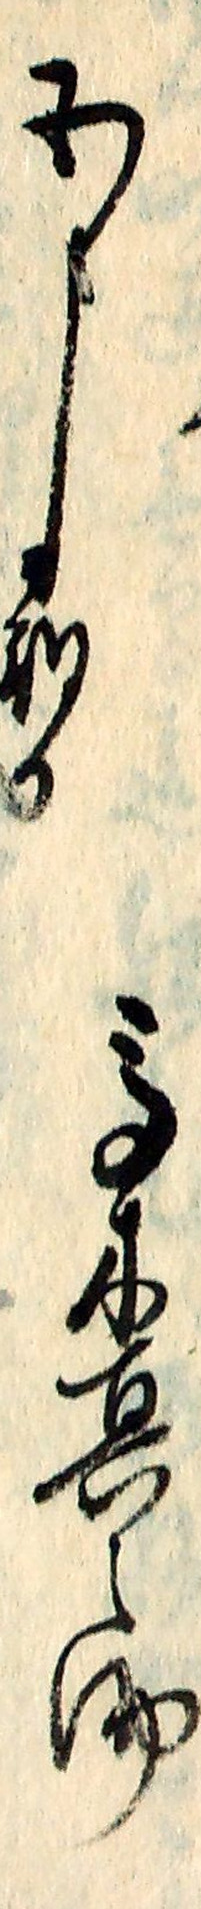五月朔日高木真之助
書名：諸御願書控(後藤氏壱番）
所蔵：鳴門教育大学 Naruto University of Education
